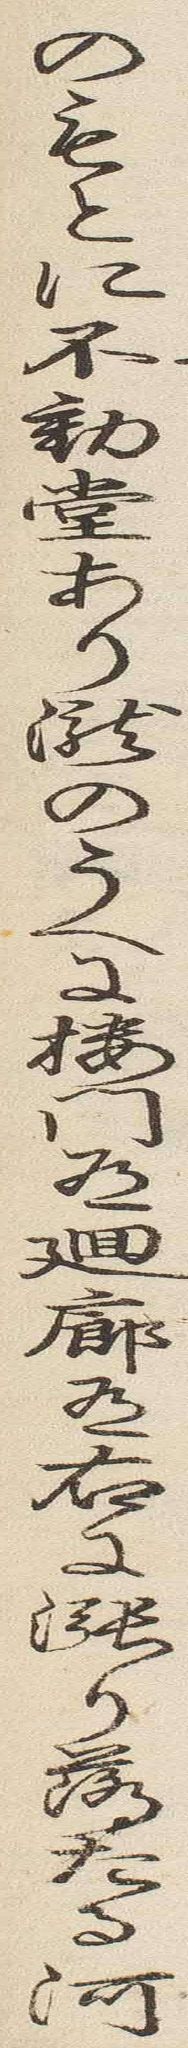のもとに不動堂あり瀧のうへに楼門有廽廊有右に漲り落たる河
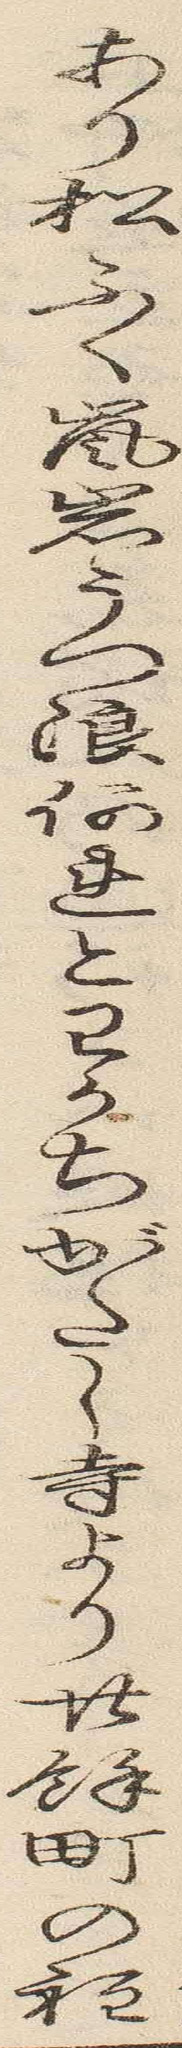あり松ふく嵐岩うつ浪何れとわかちがたし寺より廿餘町の程
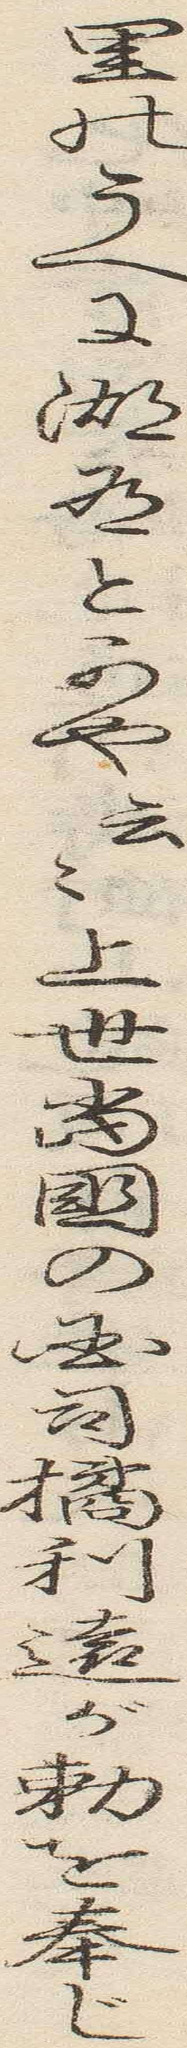里のうへに湖有とかや云〻上世當國の国司橘年遠が勅を奉じ
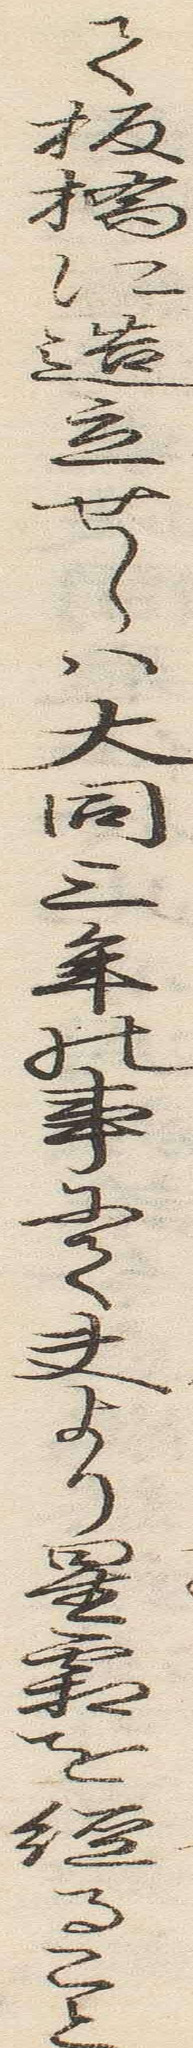て板橋に造立せしは大同三年の事にて夫より星霜を經ること
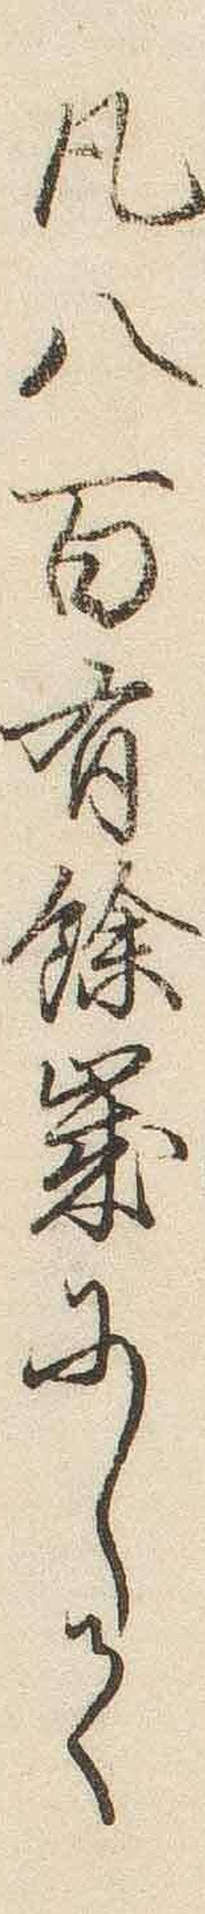凡八百有餘歳にして
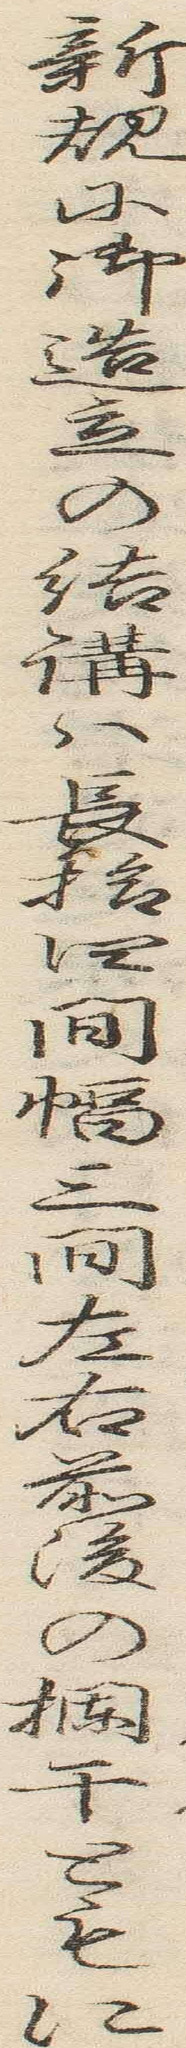新規に御造立の結構は長拾四間幅三間左右前後の欄干ともに
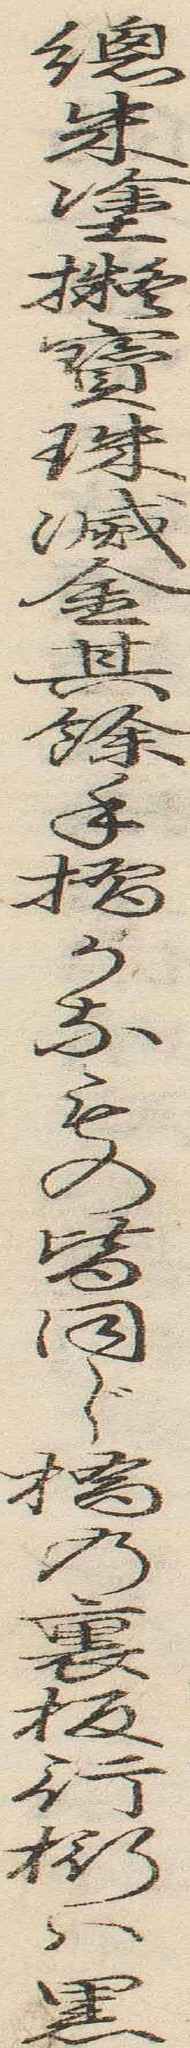總朱塗擬寶珠滅金其餘手摺かなもの皆同じ橋の裏板行桁は黒
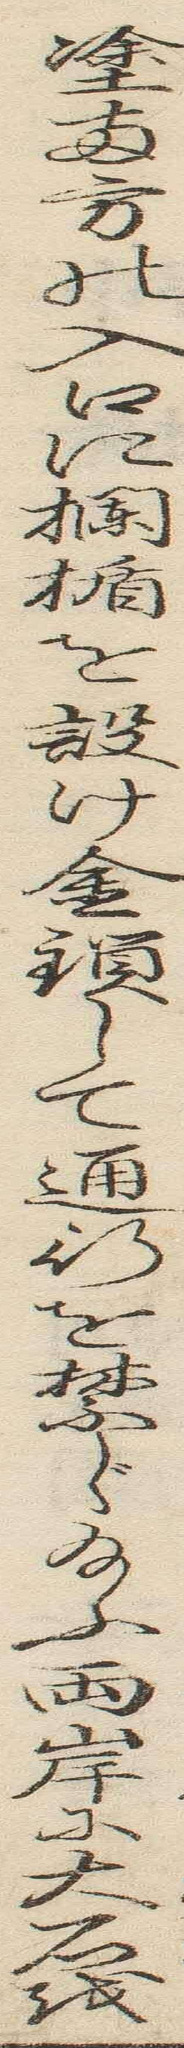塗両方の入口に欄楯を設け金鎖して通行を禁じ給ふ両岸に大石を
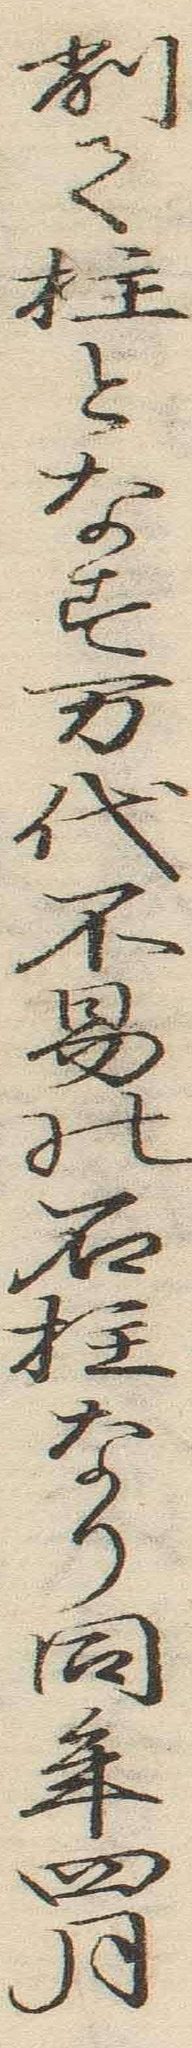削て柱となす万代不易の石柱なり同年四月
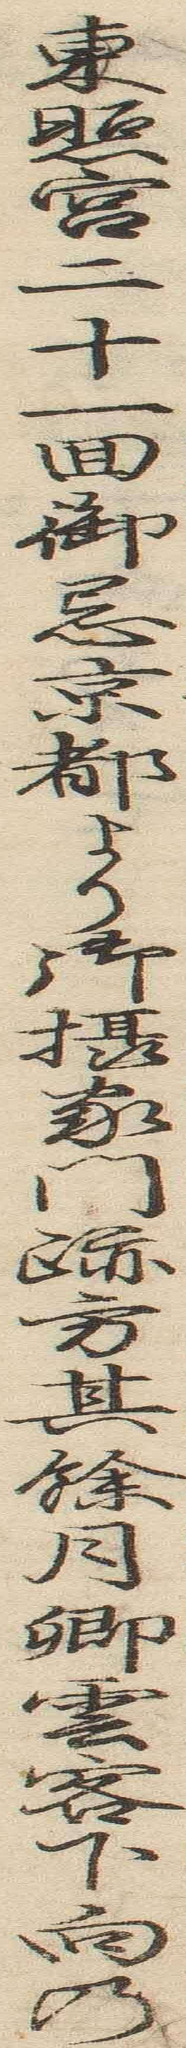東照宮二十一囬御忌京都より御攝家門跡方其餘月卿雲客下向の

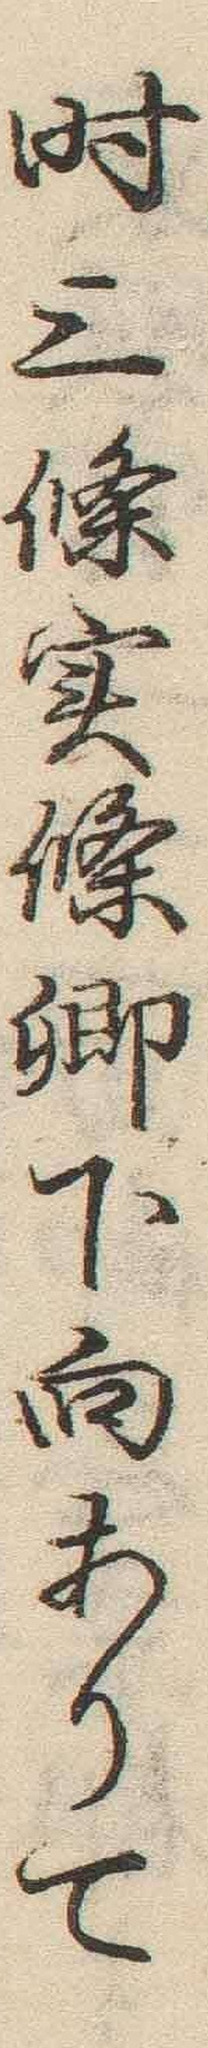时三條実條卿下向ありて
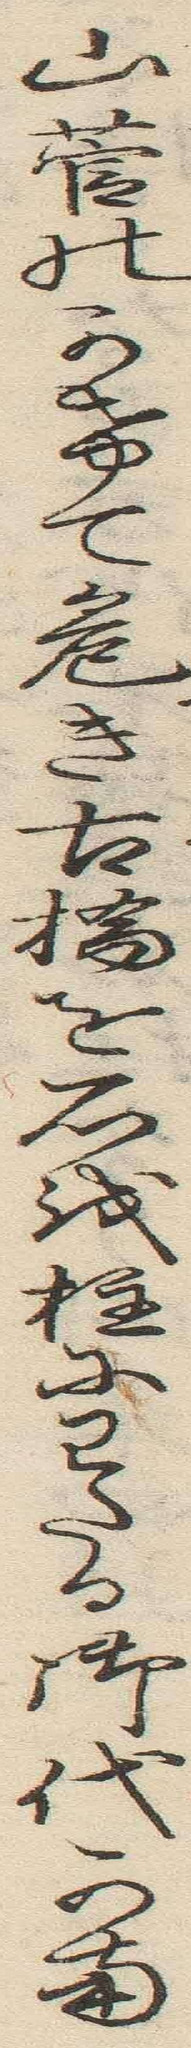山菅のかけて危き古橋を石を柱にわたる御代かな
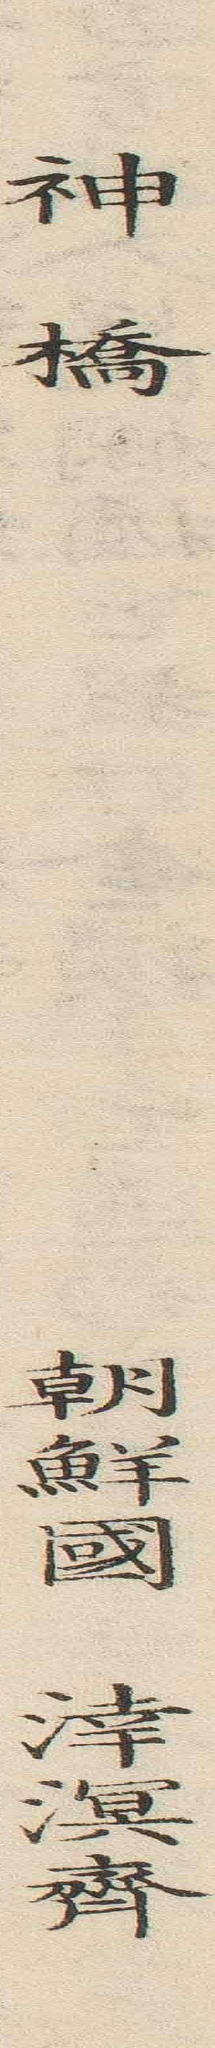神橋朝鮮國涬溟齋
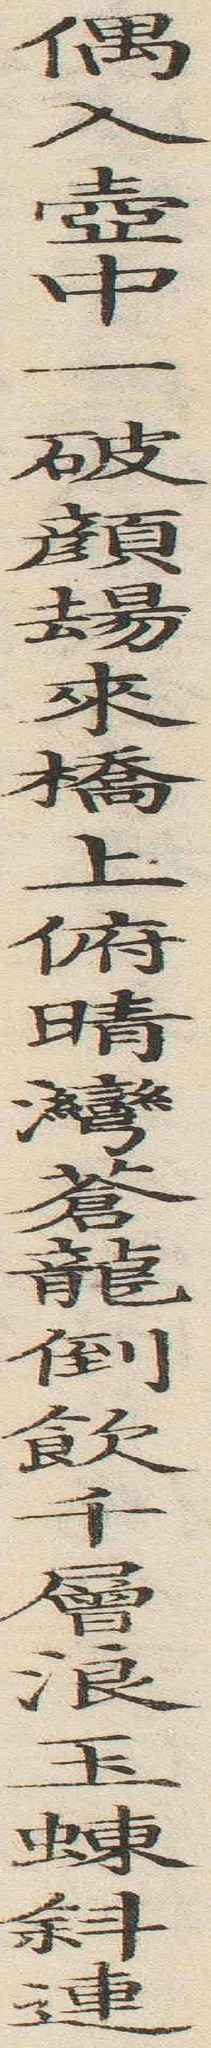偶入壺中一破顔來橋上俯晴灣蒼龍倒飲千層浪玉蝀斜連
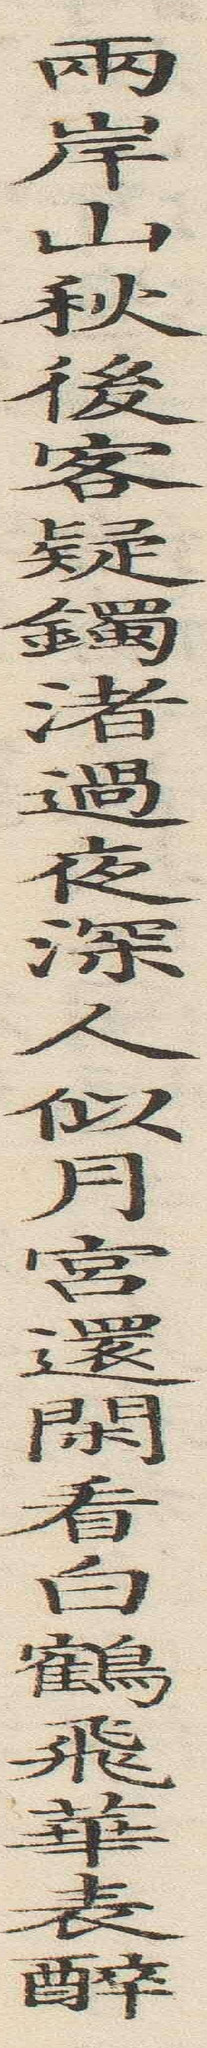兩岸山秋後客疑鐲渚過夜深人似月宮還閑看白鶴飛華表醉
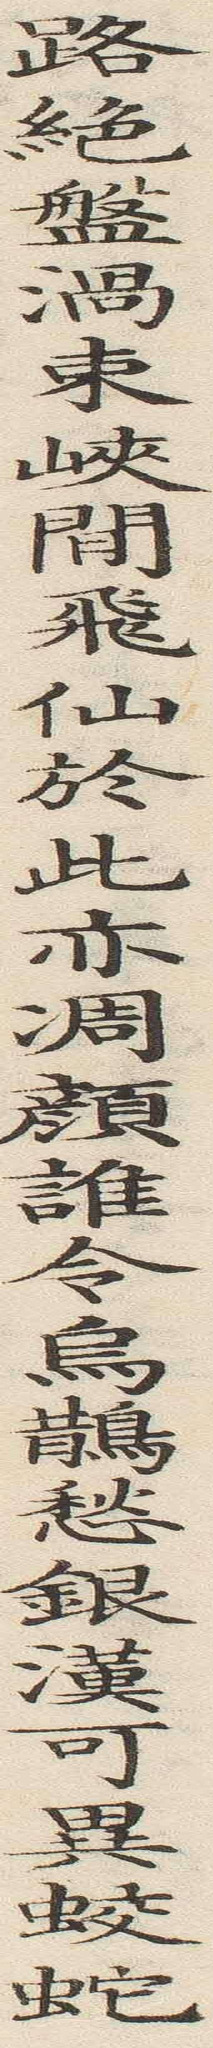路絶盤渦束峽閒飛仙於此亦凋顔誰令烏鵲愁銀漢可異蛟蛇
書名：日光山志
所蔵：東京学芸大学附属図書館 国文学研究資料館
